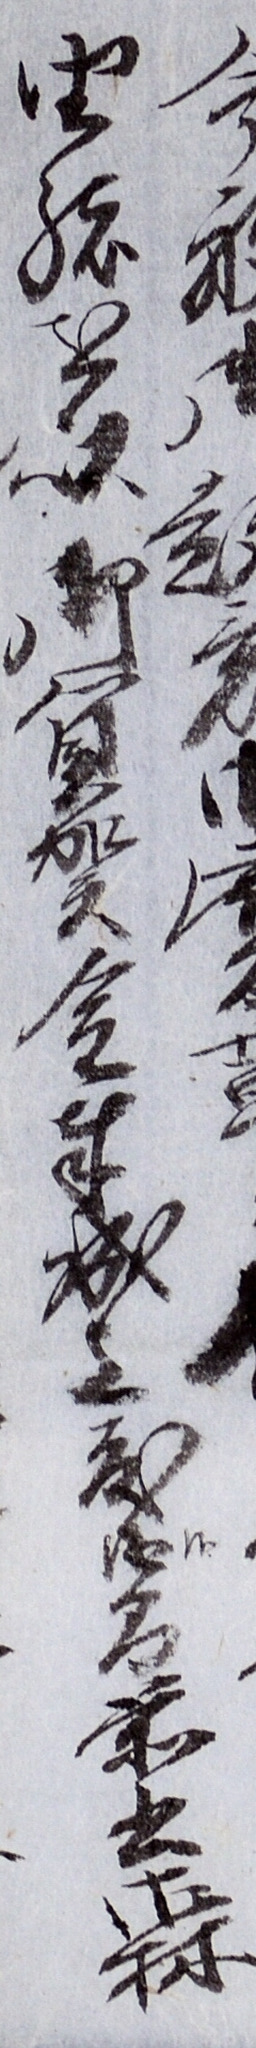由緒を以御冥賀金奉成上度候間前書御林
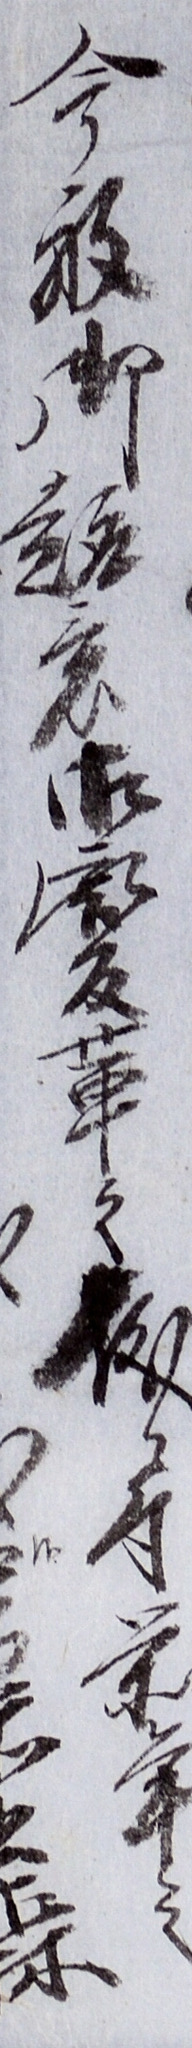今般御趣意御変革之儀ニ付前年之
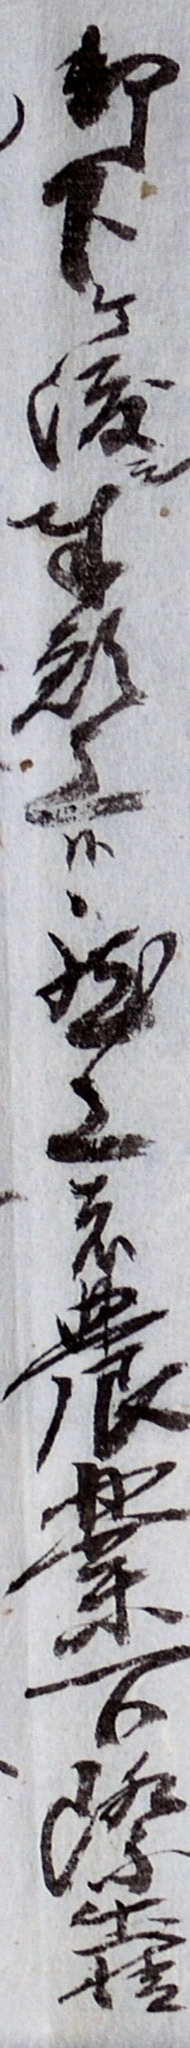御下ケ渡シ奉願上候然上者農業一ト際出情
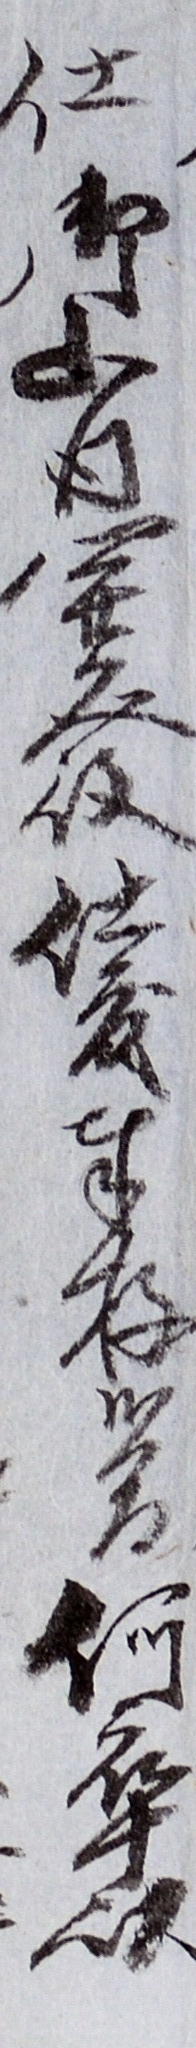仕御山内開発仕度奉存候間何卒以
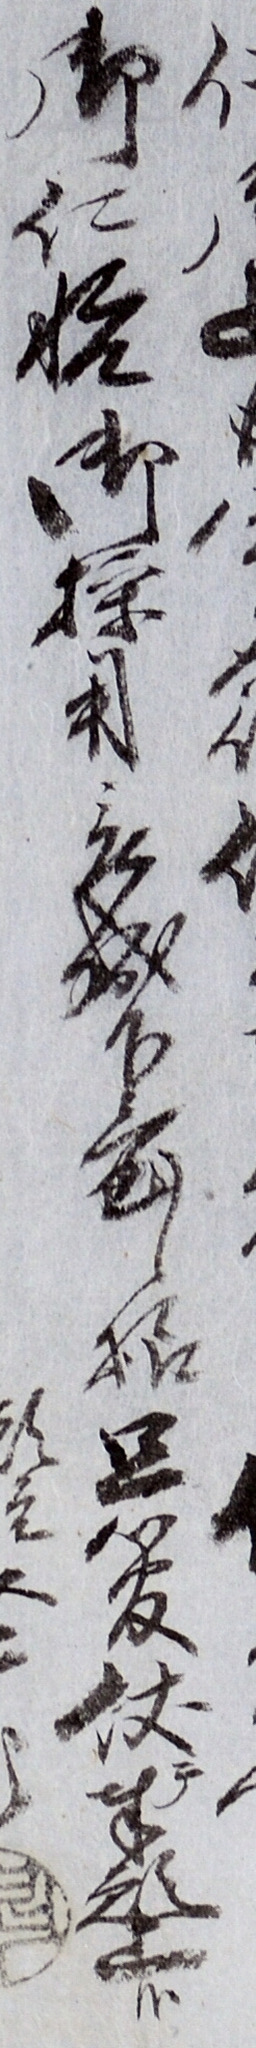御仁悦御採用被成下置候様只管伏テ奉願上候
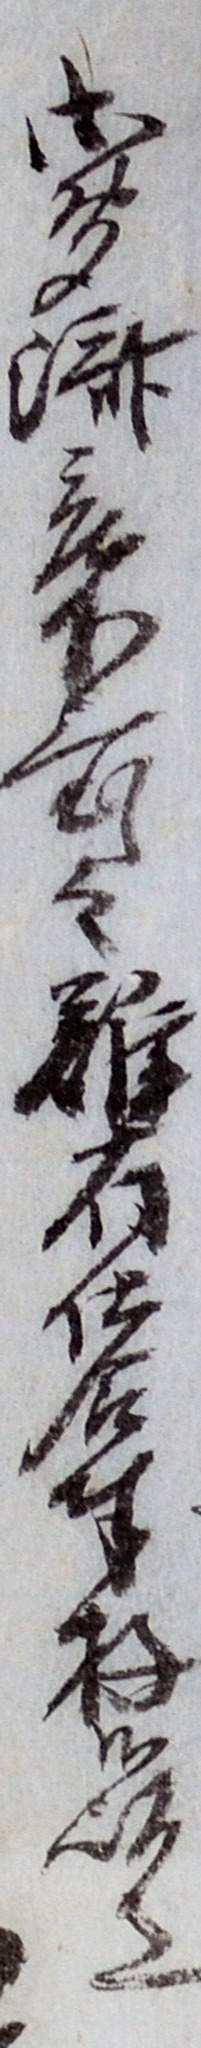御聞済被下置候ハゝ難有仕合奉存候以上
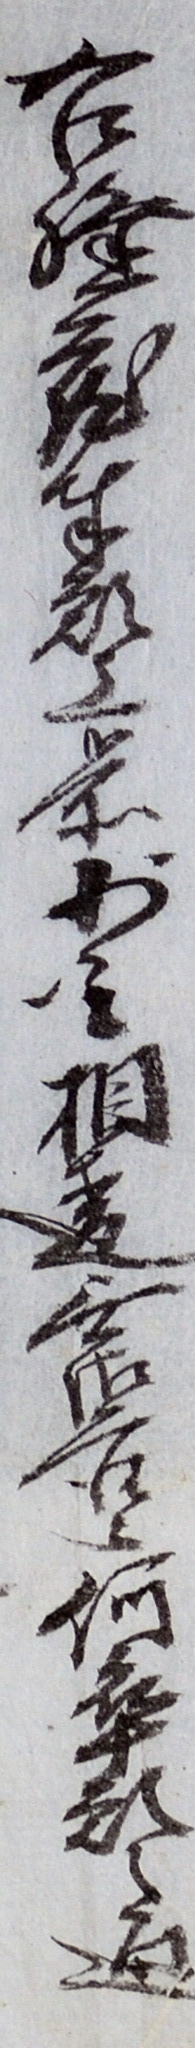右縫蔵奉願上所少も相違無御座候何卒願之通
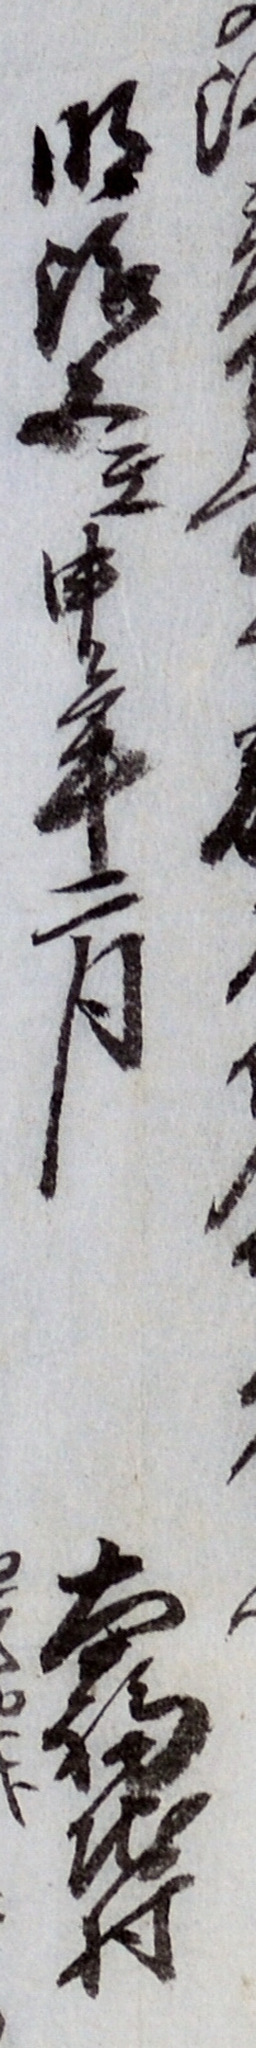明治五壬申年二月南福地村
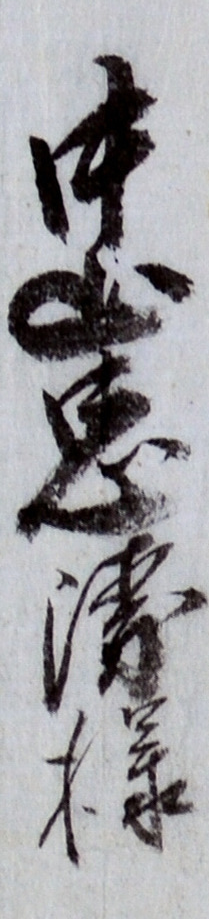中山忠清様
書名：乍恐以書付奉願上候御事
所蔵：伊那市立高遠町図書館・合同会社AMANE
